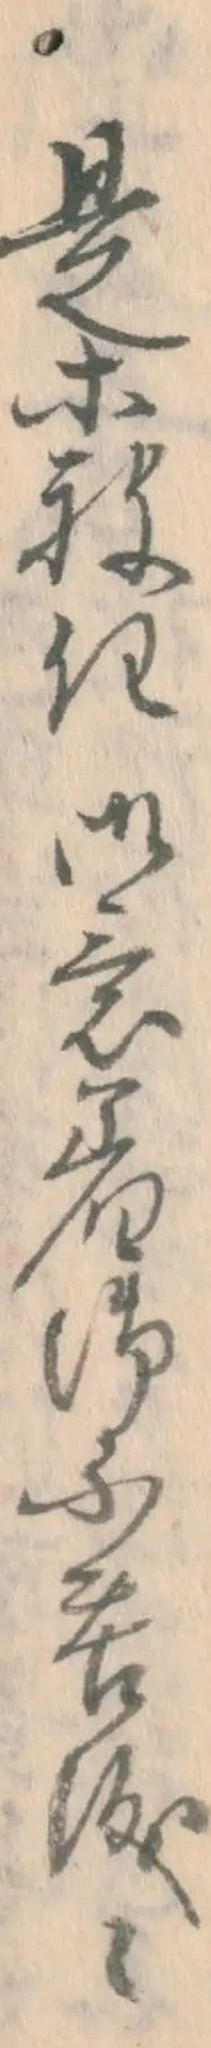是等被任御意着御不苦儀候
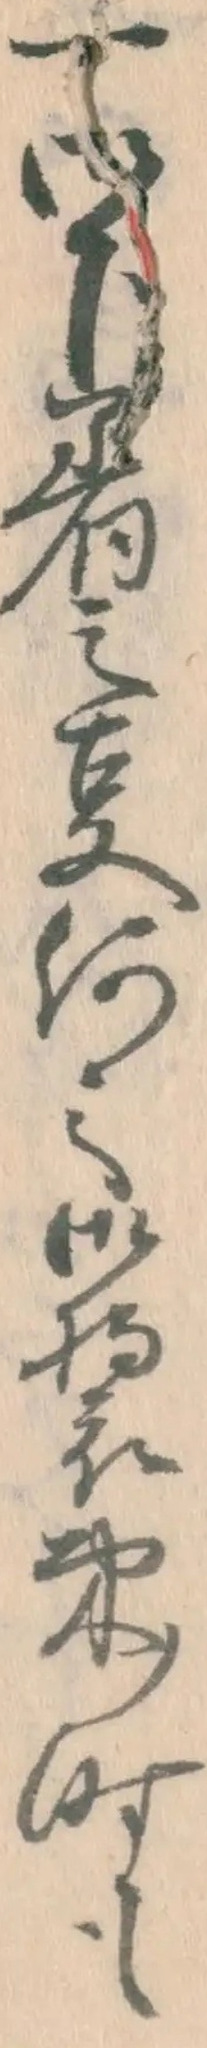一御下着之事何之御装束ノ時も
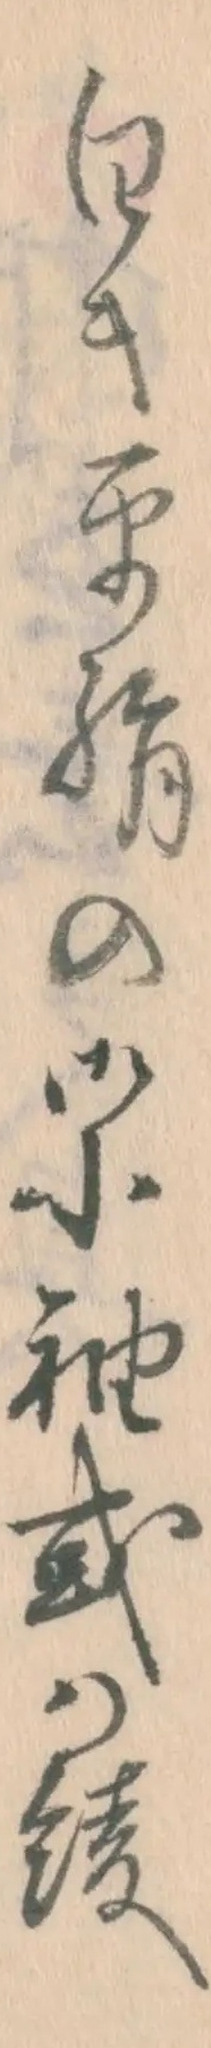白き平絹の御小袖或ハ綾
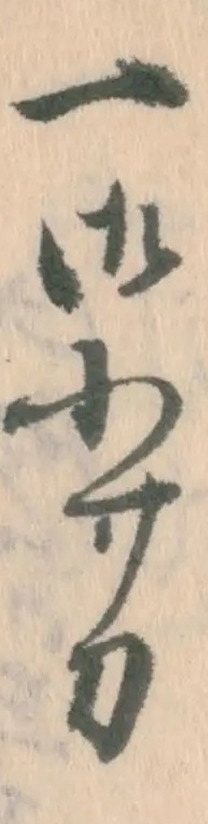一御小さ刀
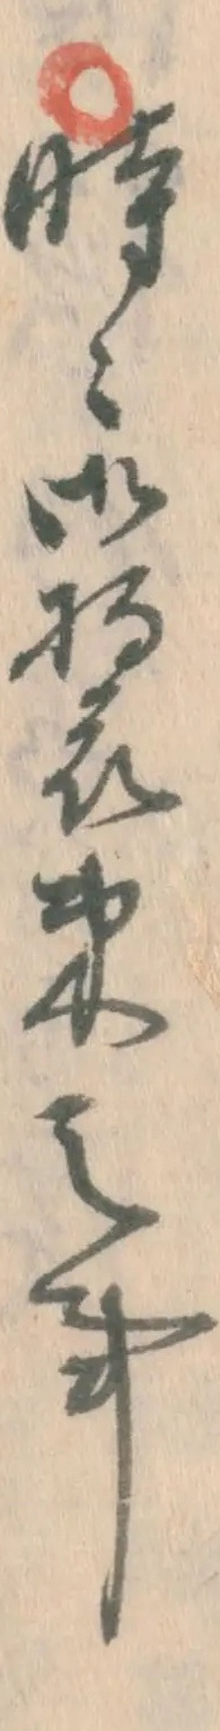○時々御装束之事
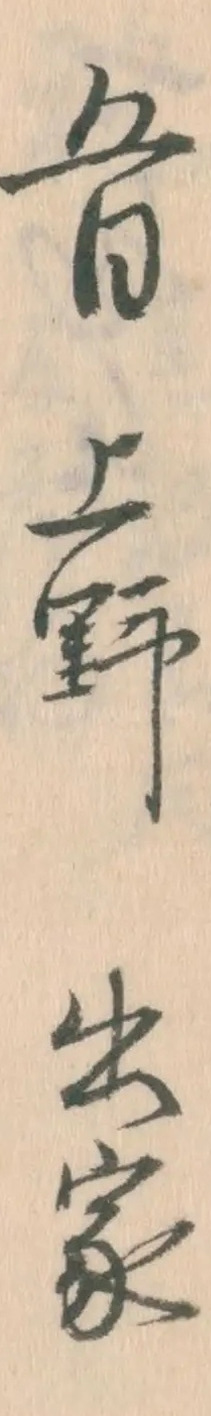五日上野出家
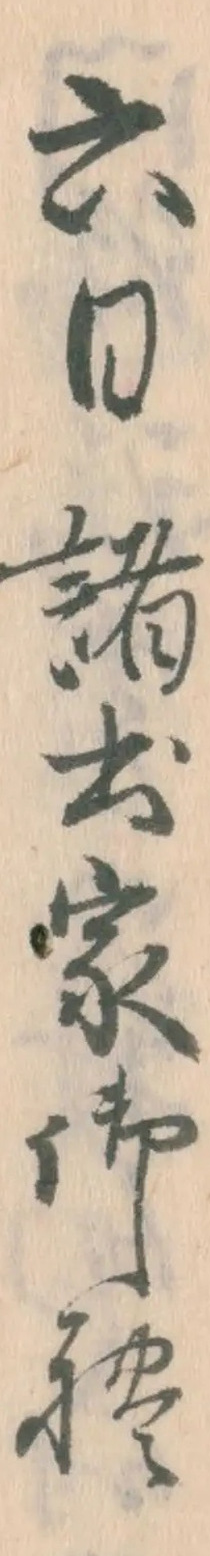六日諸出家御礼
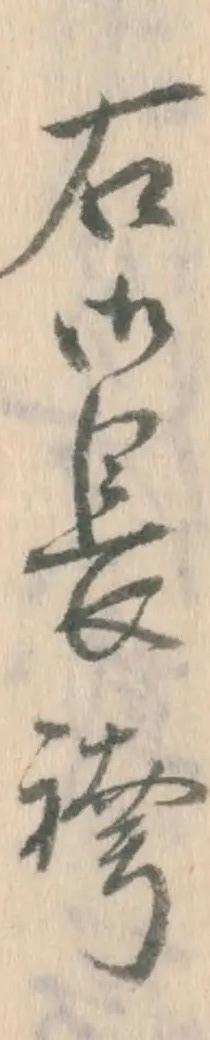右御長袴
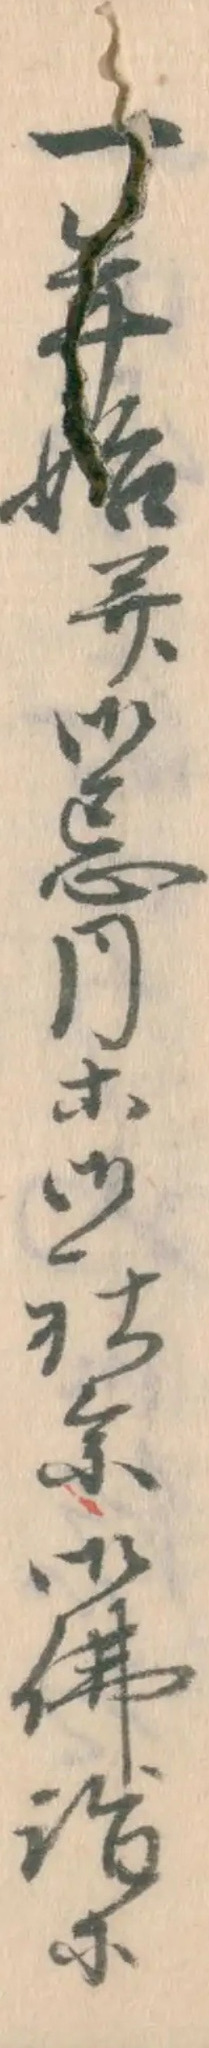一御年始并御忌月等御社参御仏詣等
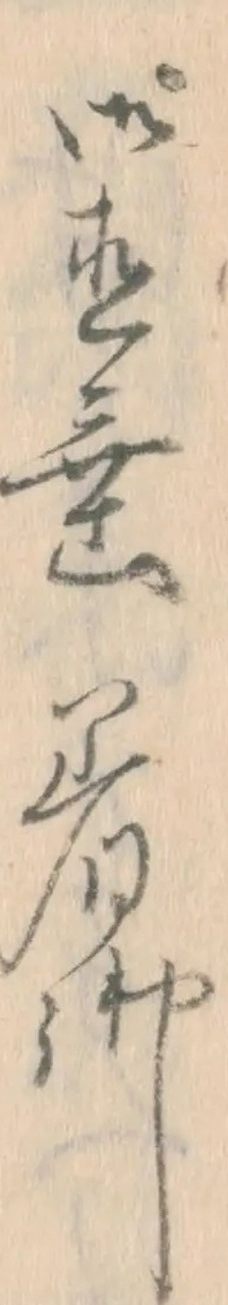御直垂着御
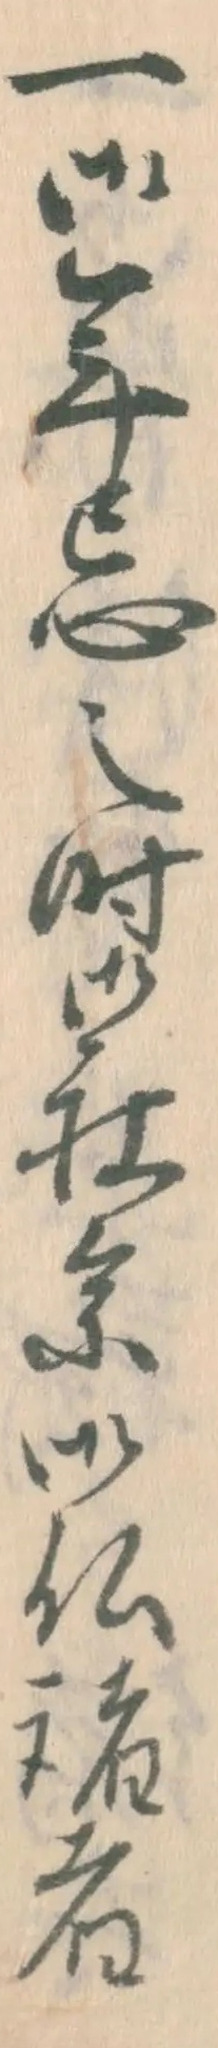一御年忌之時御社参御仏諸者
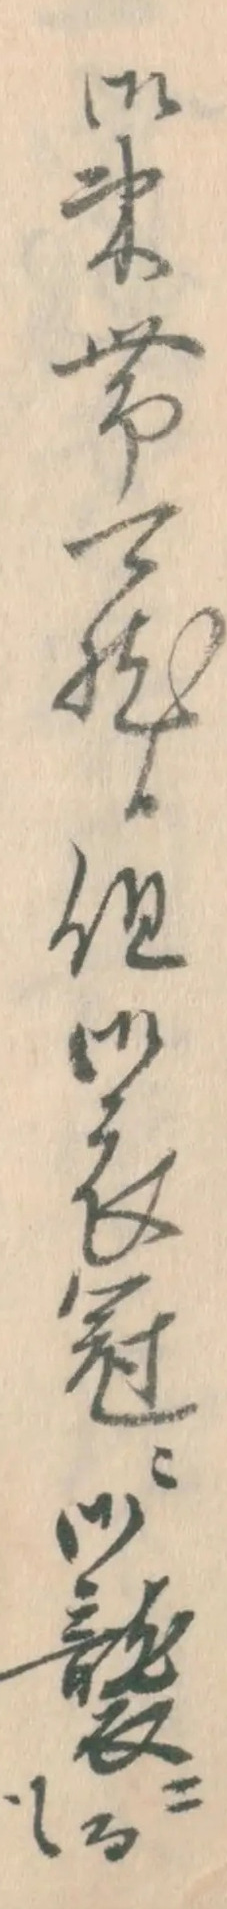御束帯可然候但御衣冠ニ御襲ニ而も
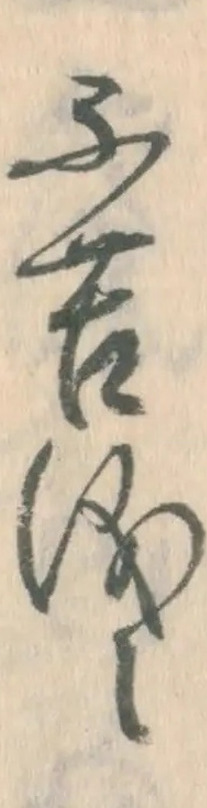不苦儀候
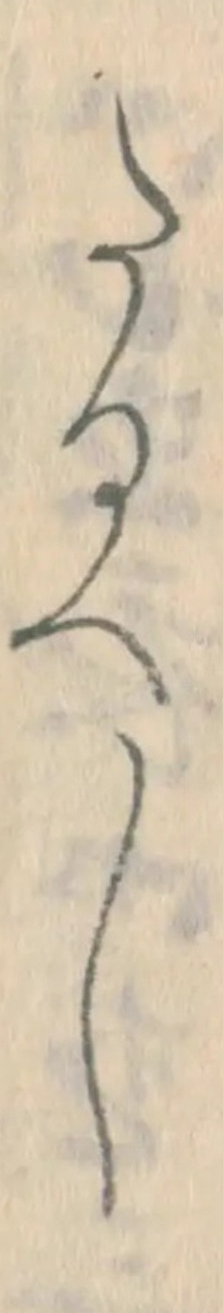たるへし

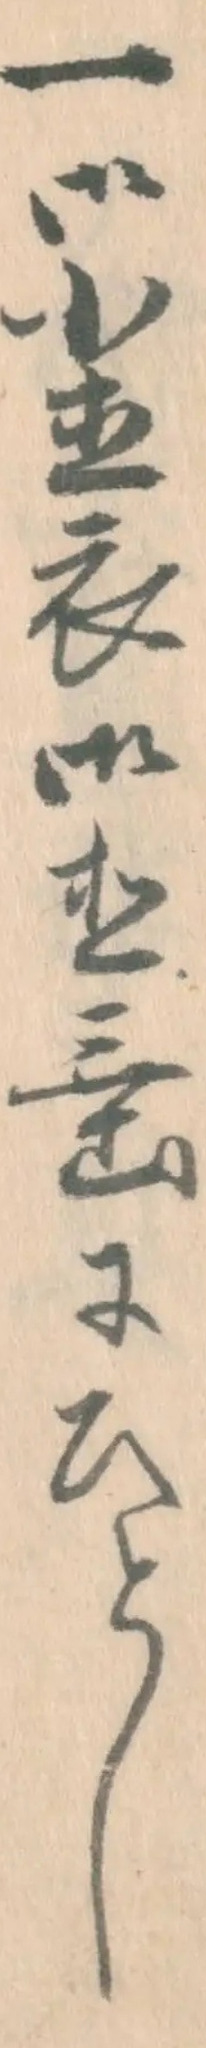一御小直衣御直垂にひとし
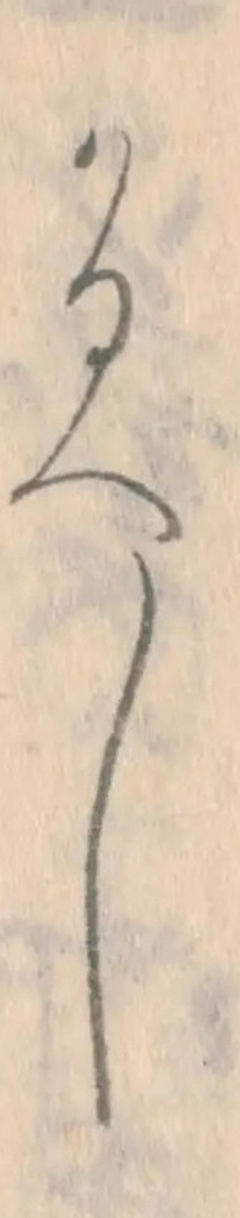かるへし
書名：賀茂社記録. 第80冊
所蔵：国立国会図書館 National Diet Library, JAPAN
